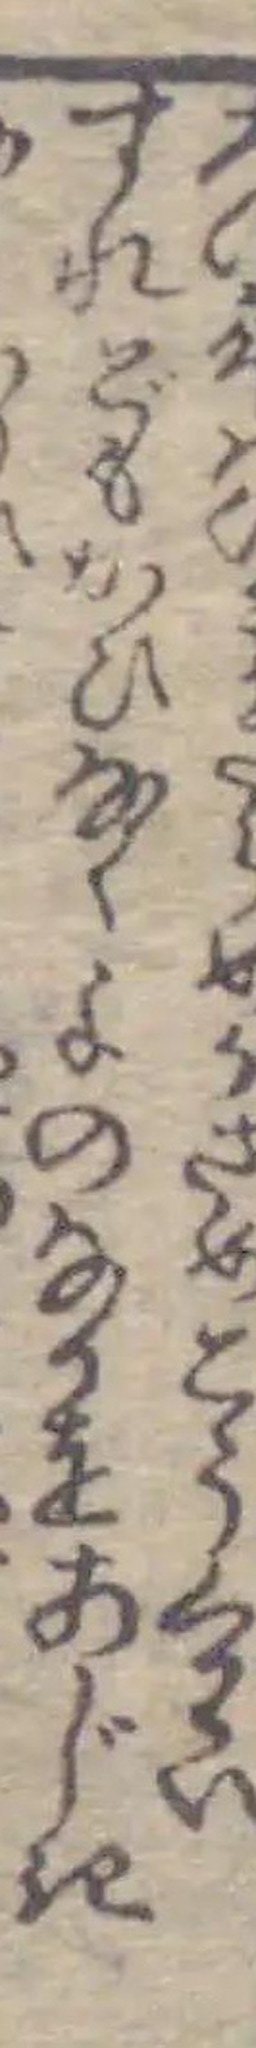すれどもかひなくよのなかをあじき
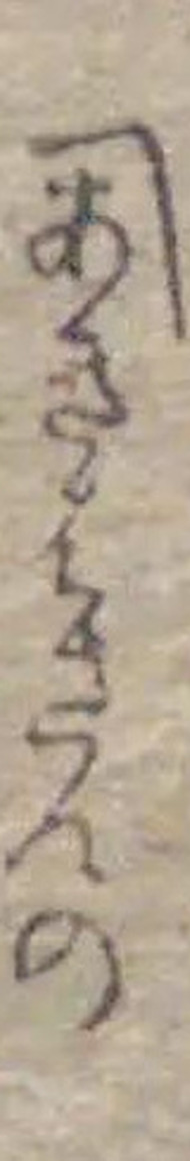〽あきはさんの
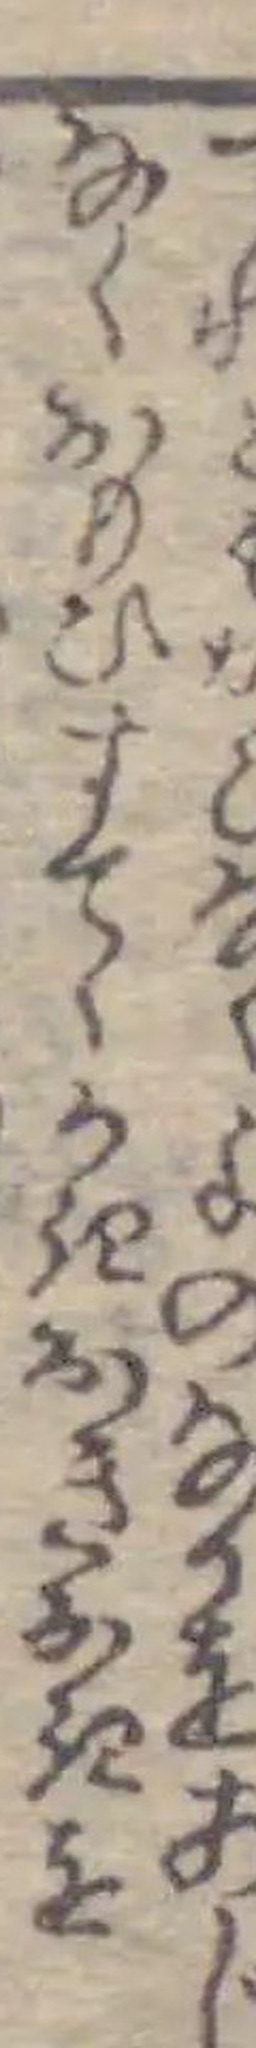なくおもひすてゝかきおきかきを
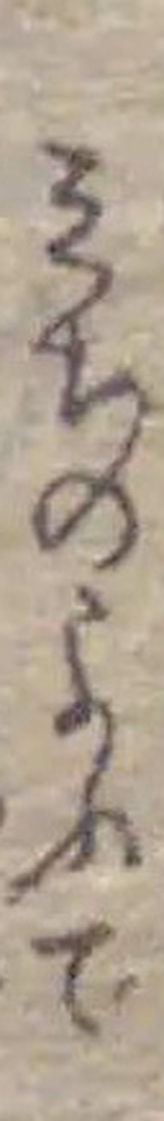みちのよふで
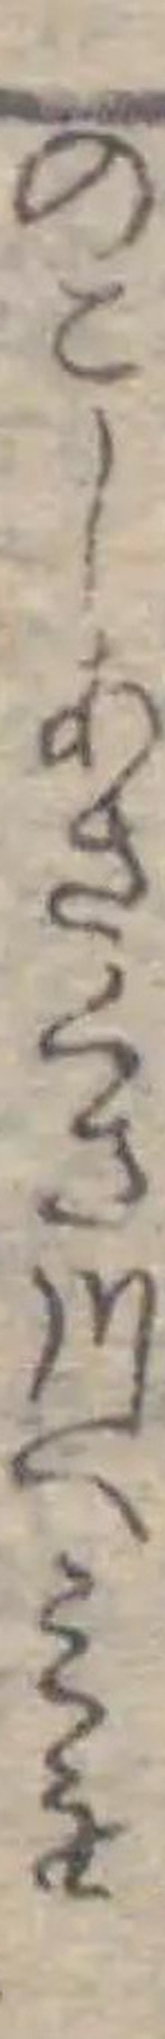のこしあさくさ川へみを
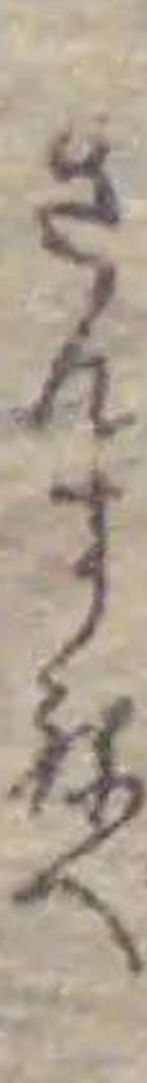さんすねえ
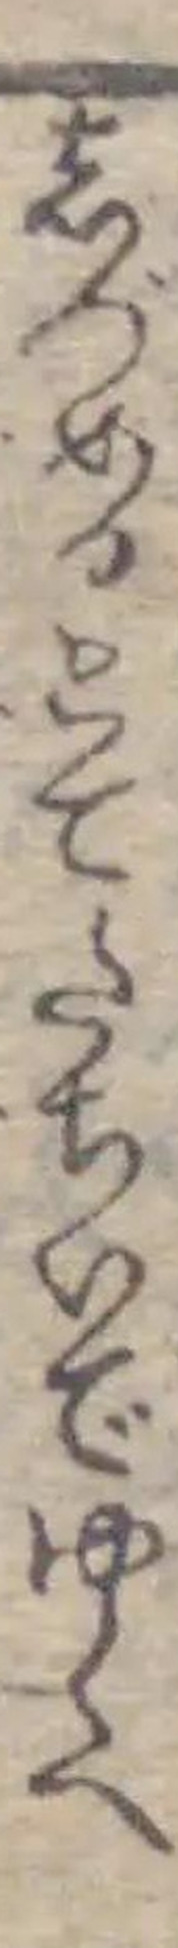しづめるとてたちいでゆくへ
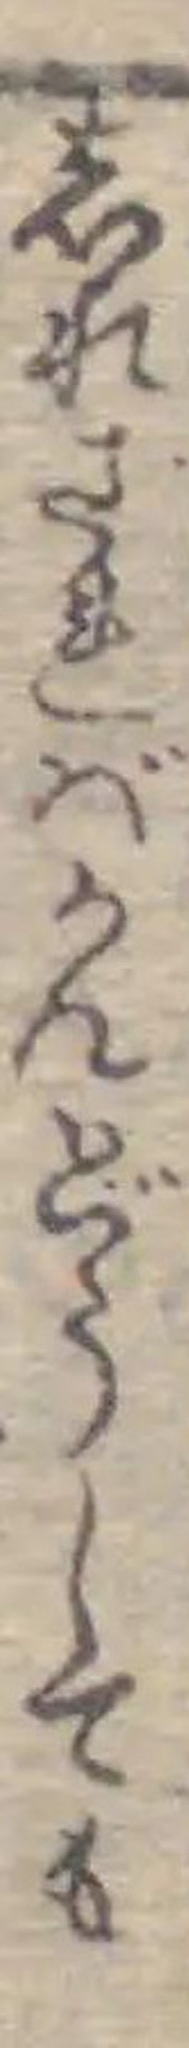しれざればかんどうしても
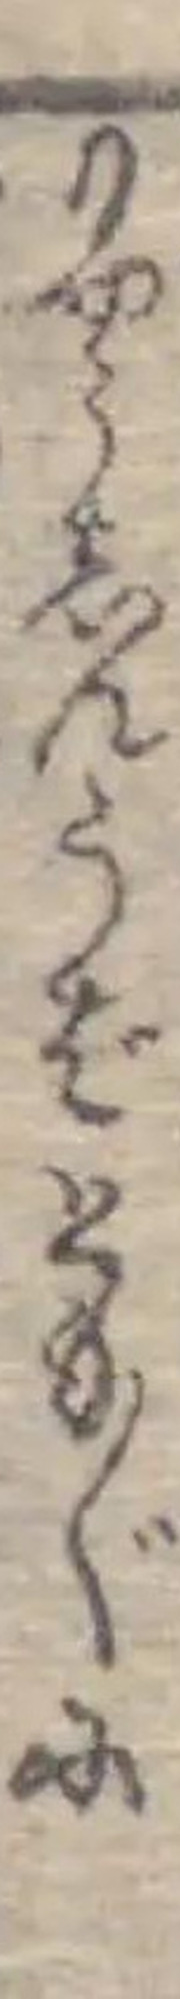りやうしんうばとも〴〵に
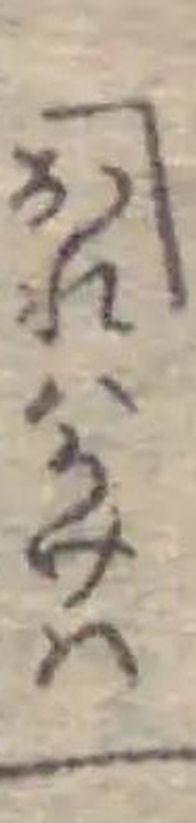〽おれはかけは
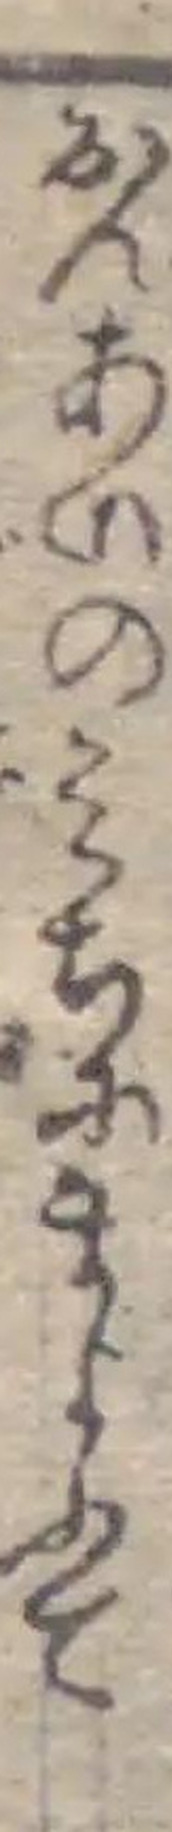おんあいのみちにまよふて
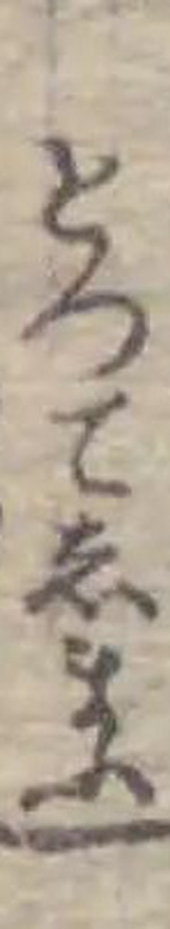とつてしまふ
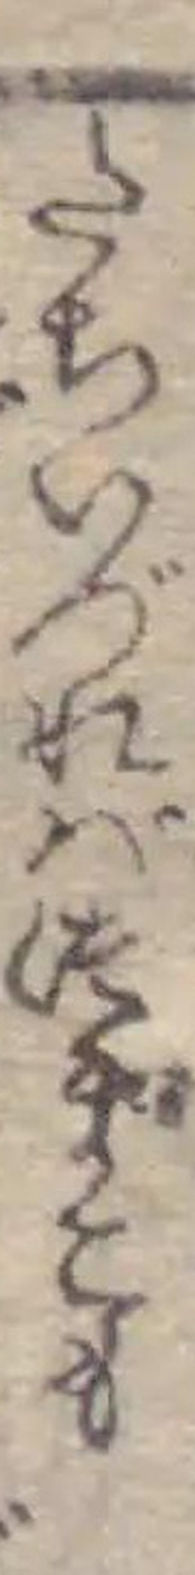たちいづればつまこも
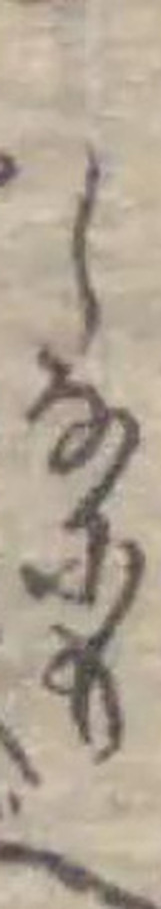しなにも
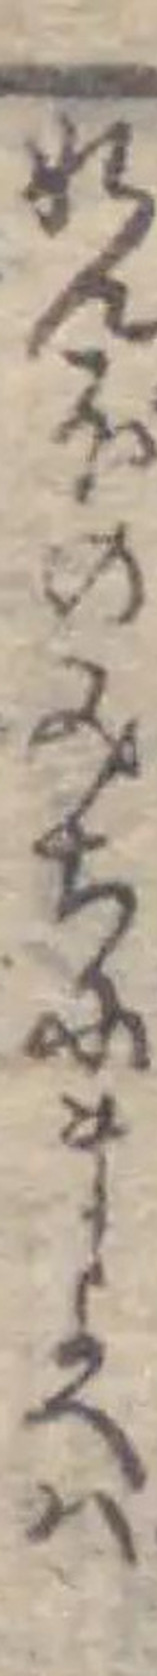れんぼのみちにまよへば
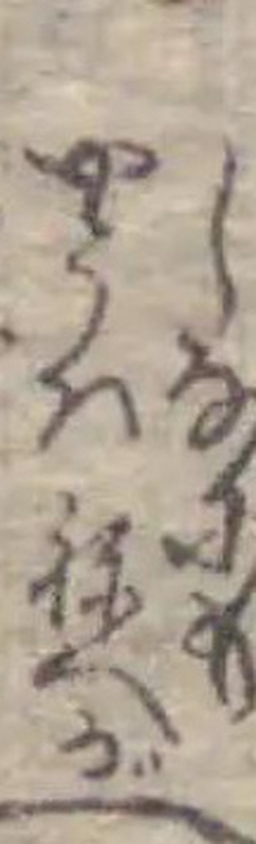やうはねへが
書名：福壽海旡量品玉 3巻
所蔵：国立国会図書館 National Diet Library, JAPAN
